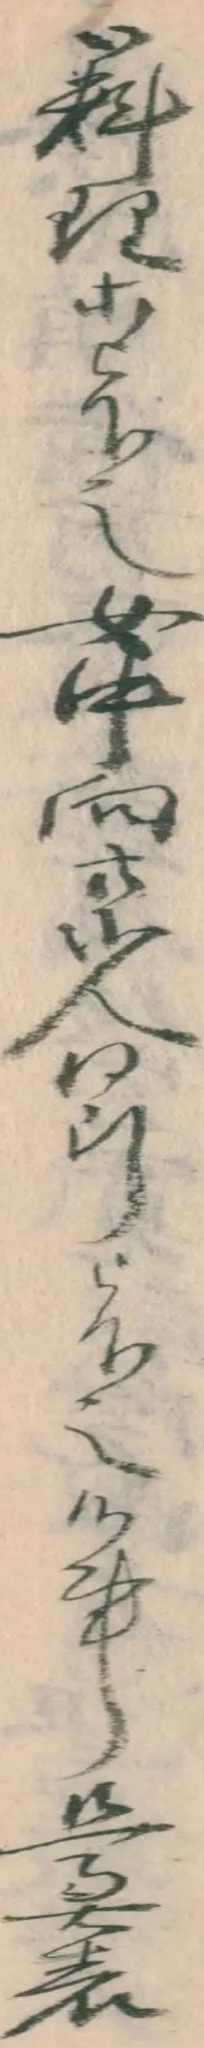御料理等被下也女中向共弐人同断被下之候事且奥表
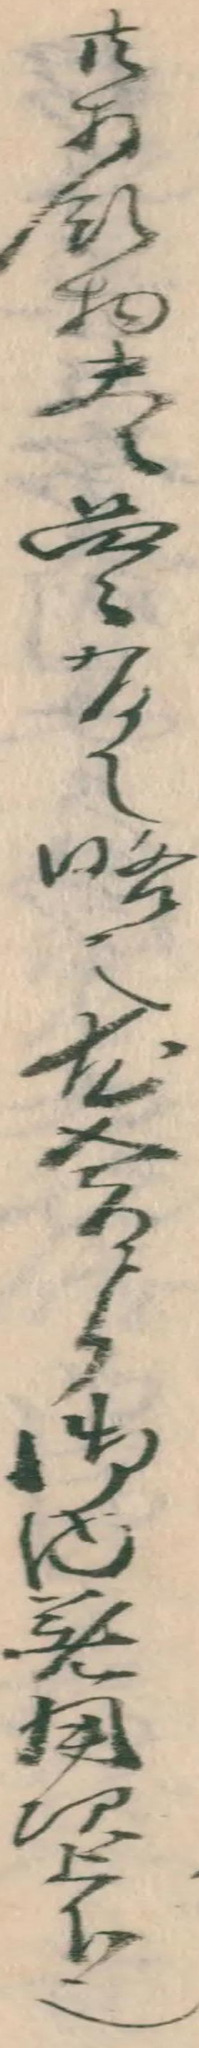共拝領物夫々品々有之略之尤五方ニ而御内着用次上下也
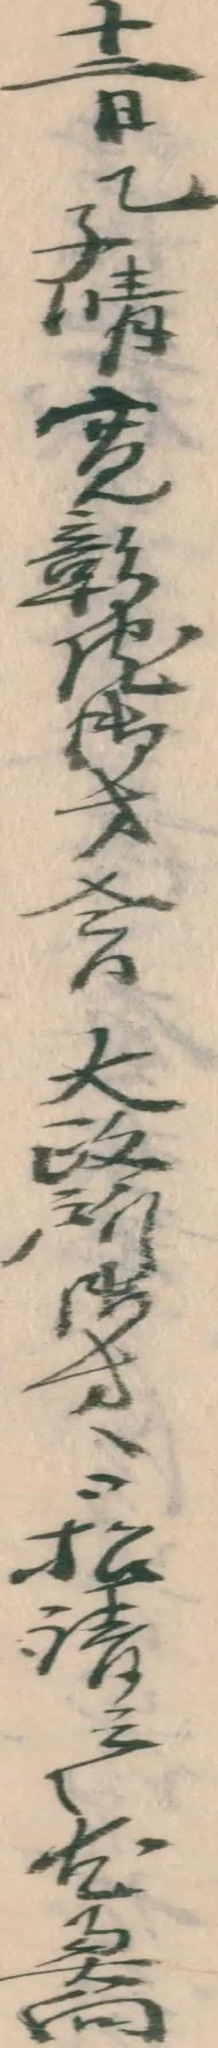十二日乙子晴寛彰院御方今日大政所御方へ御招請云々尤奥向
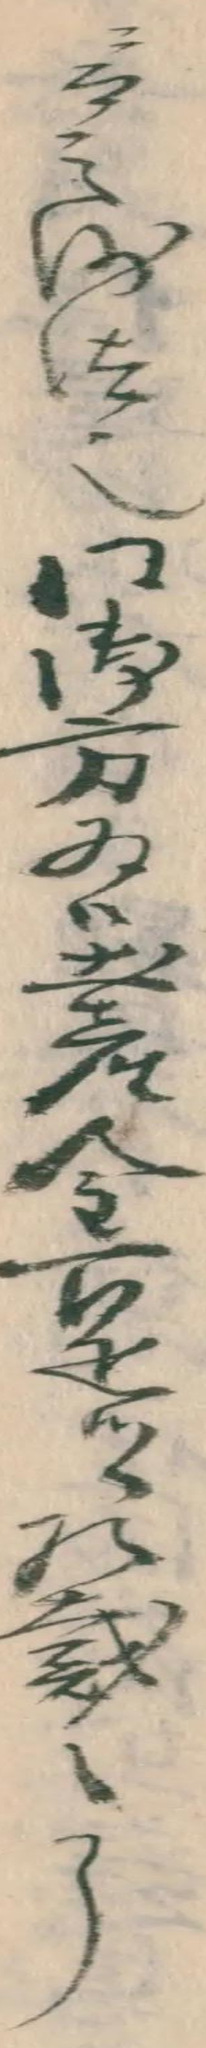ニ而之沙汰也同御方為ハ土産金百疋ツヽ頂戴之了
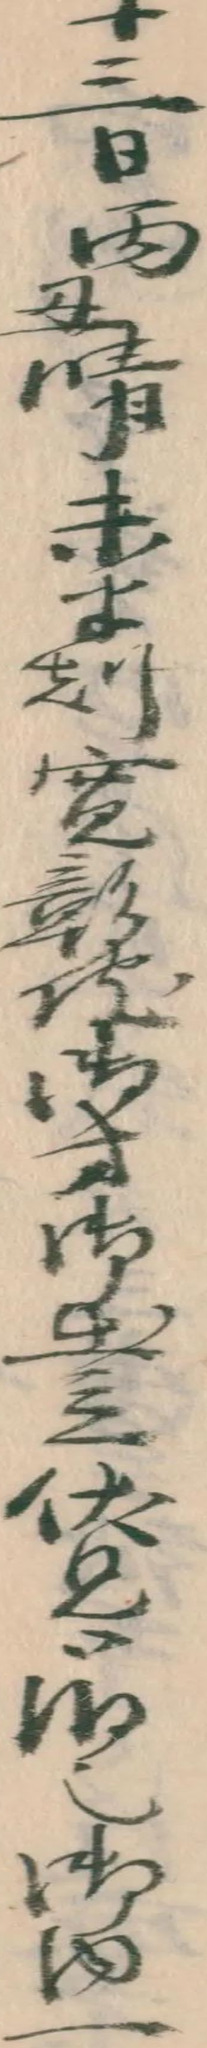十三日丙丑晴未半刻寛彰院御方御出立伏見御泊也御内一
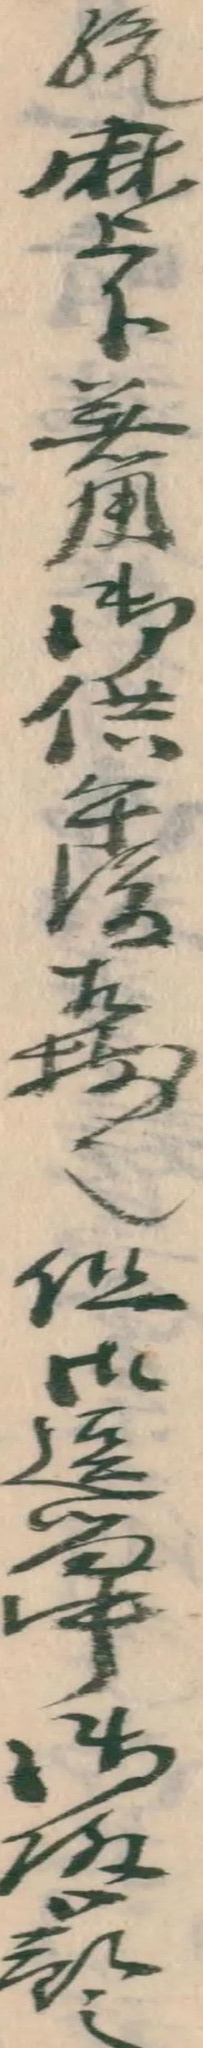統麻上下着用御供午後相揃也但御逗留中御殿御預之
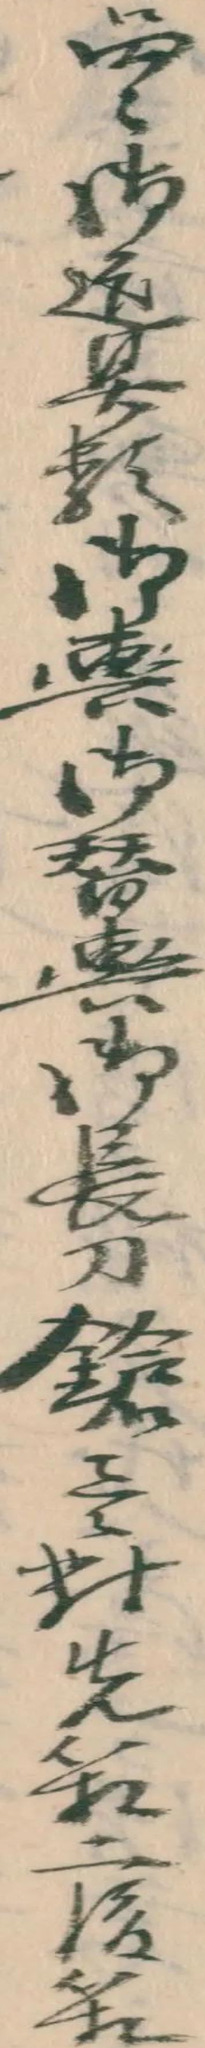品々御道具類御輿御替輿御長刀鎗壱對先箱二後箱
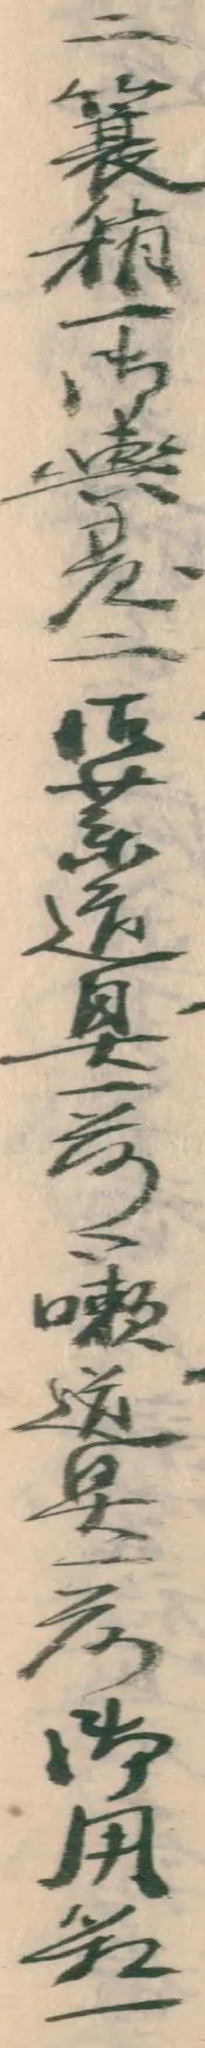二簑箱一御輿臺二御薬造具一荷御嗽道具一落御用箱一
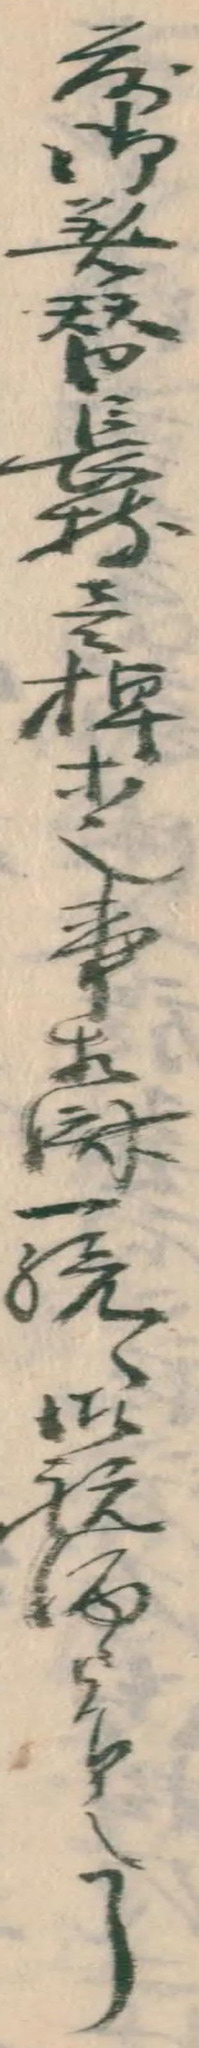前御着替長持壱棹等也事相済一統へ御祝酒被下之了
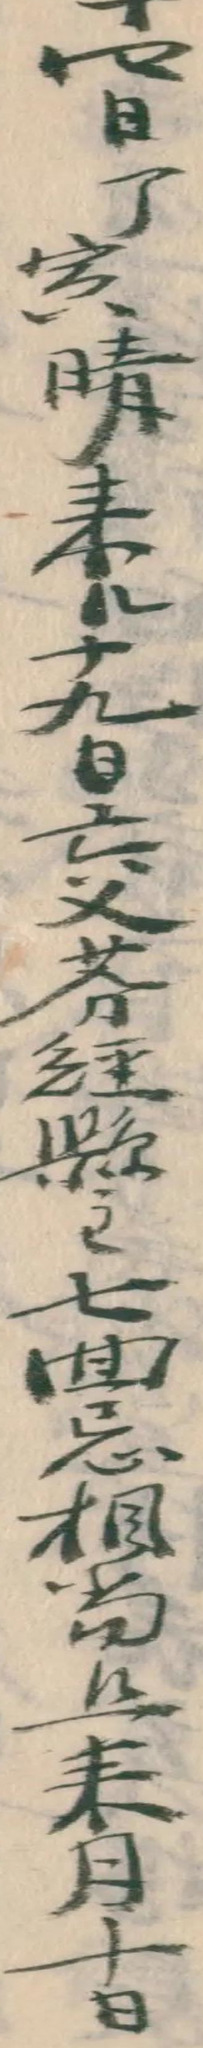十四日丁寅晴来ル十九日亡父芬経縣主七回忌相當旦来月十日
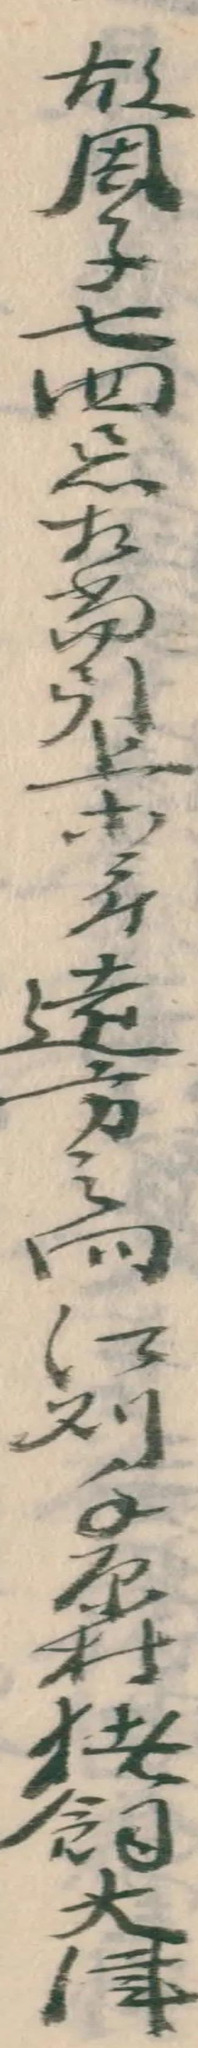故周子七回忌相當引上等ニ付遠方之向江州手原村猪飼大津
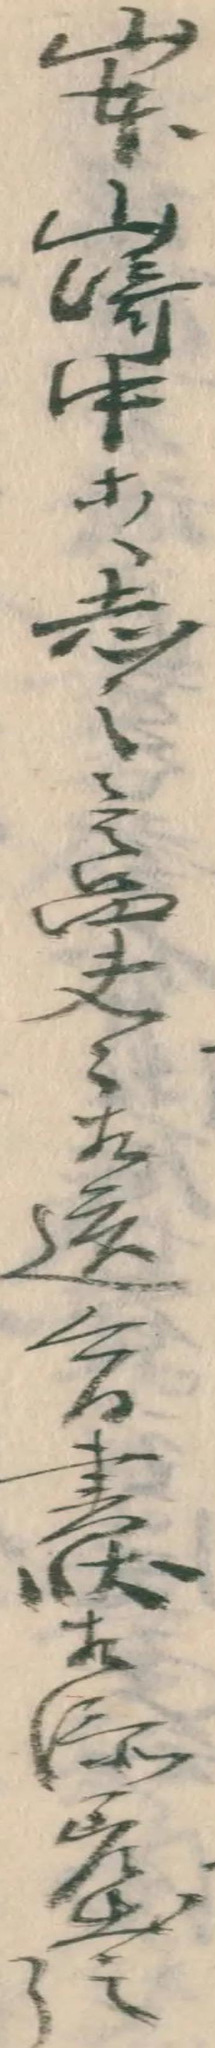山本山崎中等へ志之壱品夫々相送今日書状相添差出之了
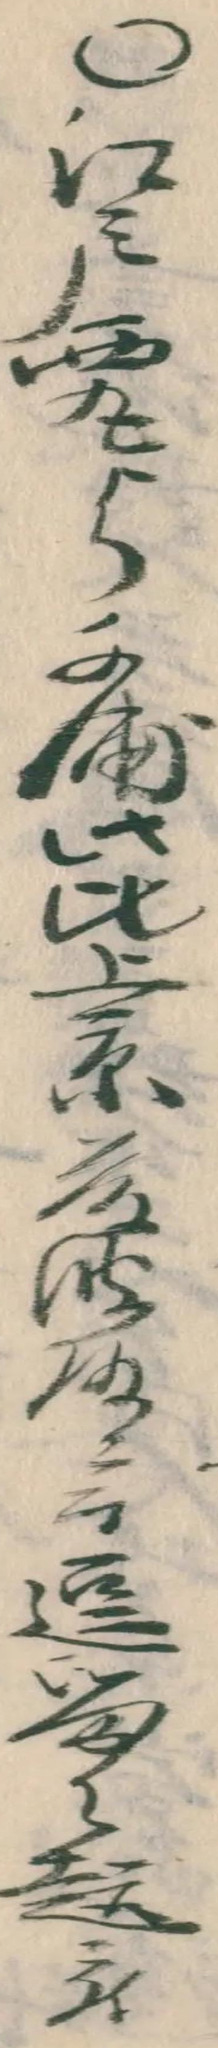○江戸西丸より千浦此比上京藤波殿ニ而逗留之趣ニ付
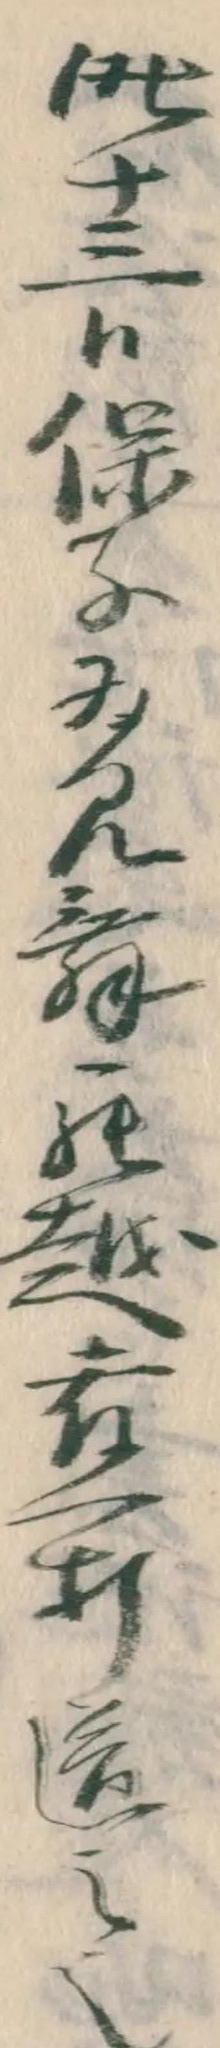昨十三日保子為見舞罷越肴一折送之也
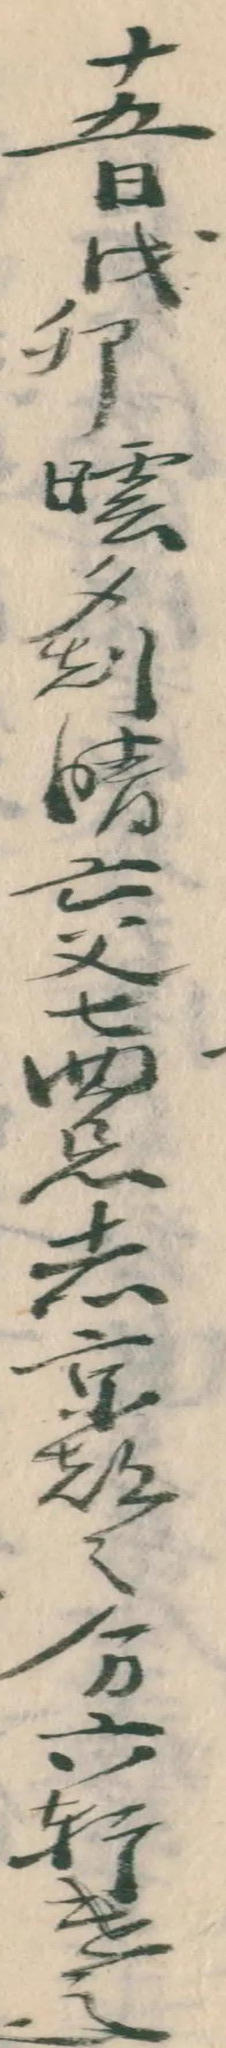十五日戊卯曇夕刻晴交七回忌は京都之分六軒遣之也
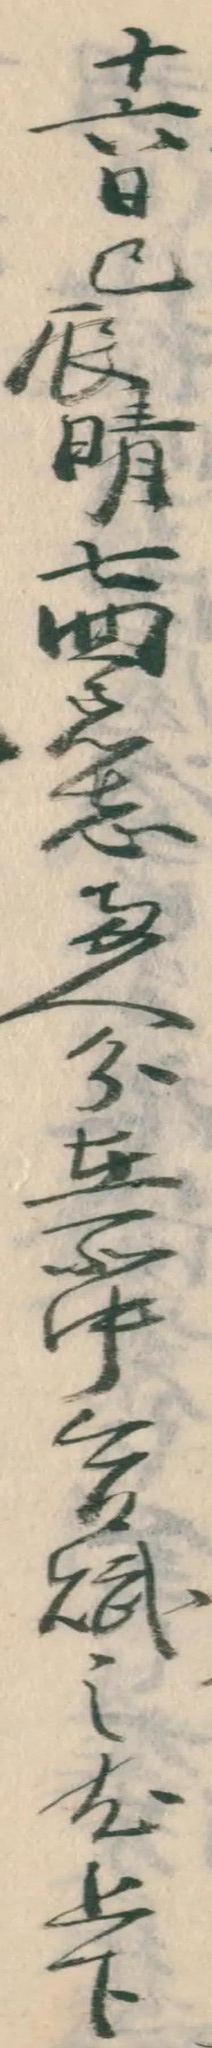十六日己辰晴七回着志両人分在所中今日賦也尤上下
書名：賀茂社記録. 第66冊
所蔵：国立国会図書館 National Diet Library, JAPAN
